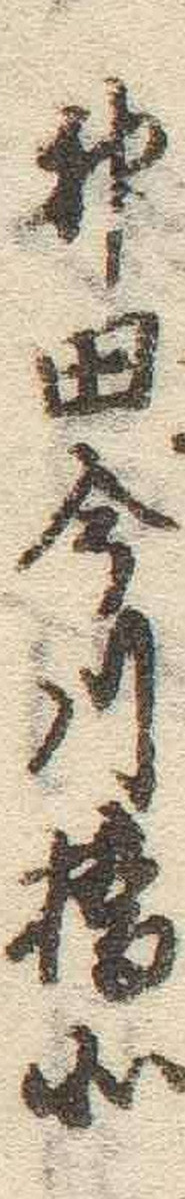神田今川橋北
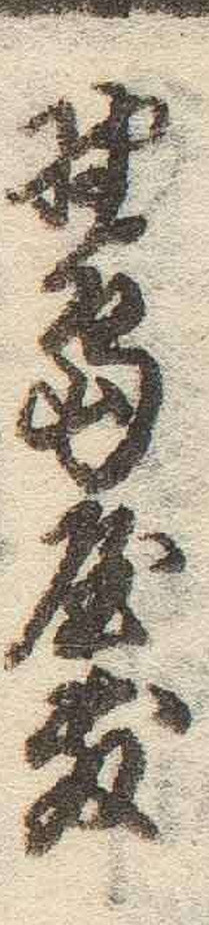野島屋敷
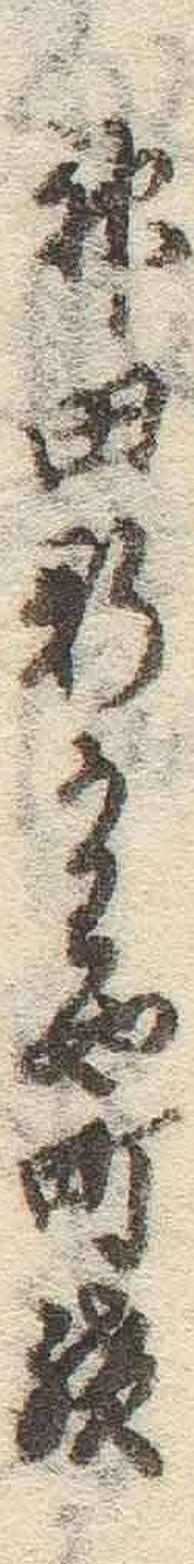神田新かわや町続
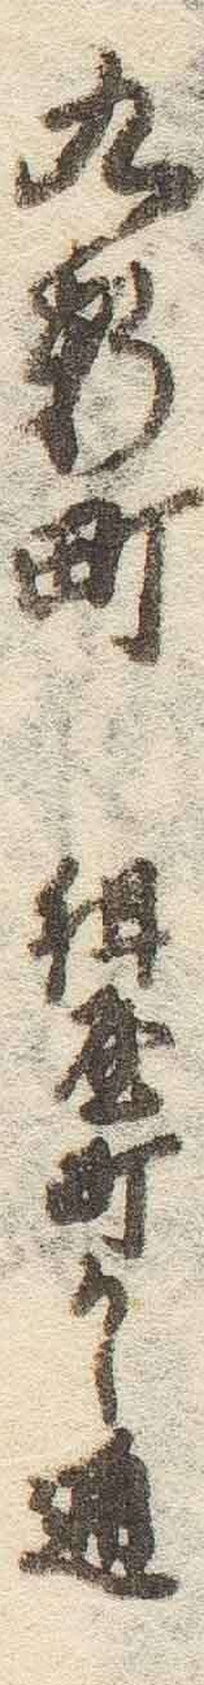九新町紺屋町かし通
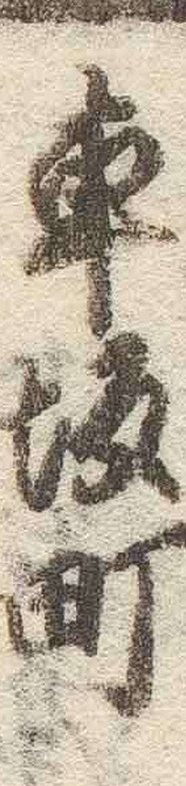車坂町
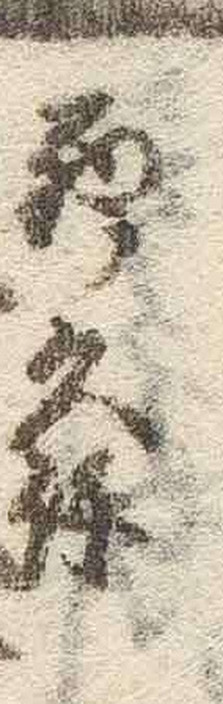西ノ久保
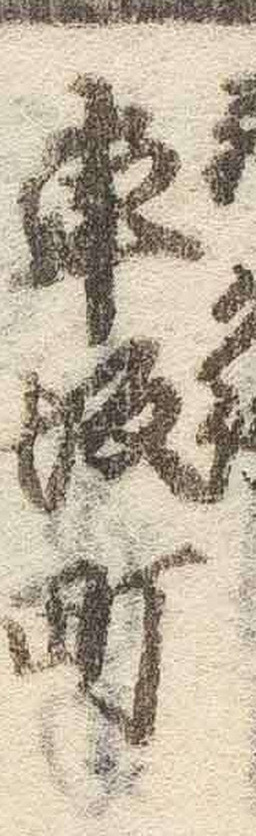車坂町
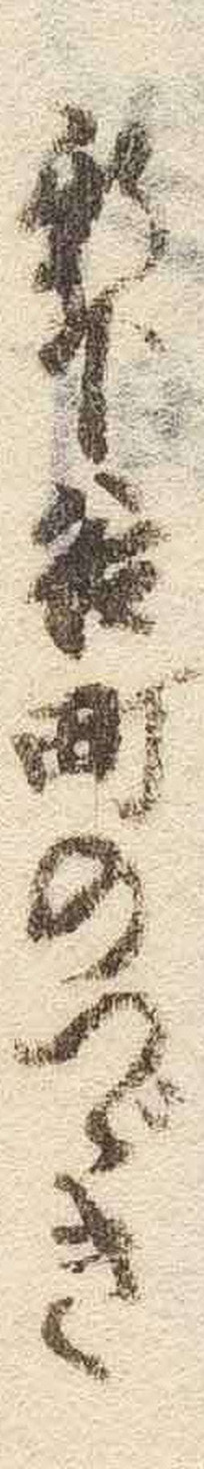新下谷町のつゞき
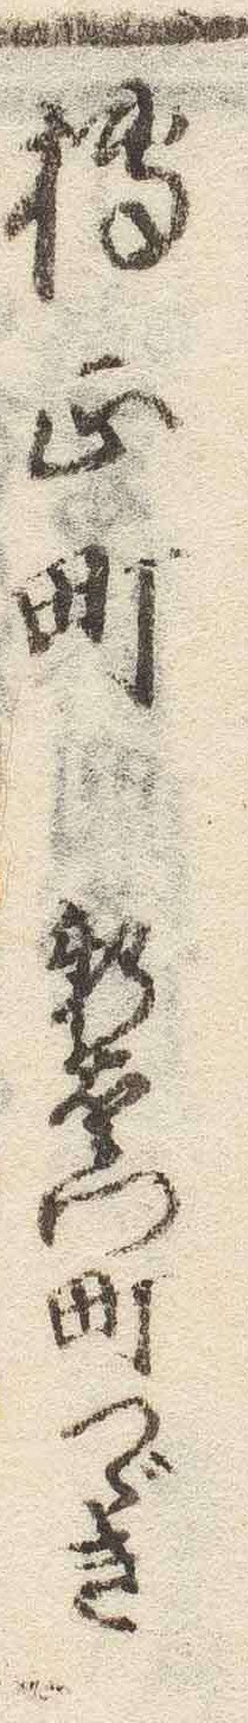榑正町新右衛門町つゞき
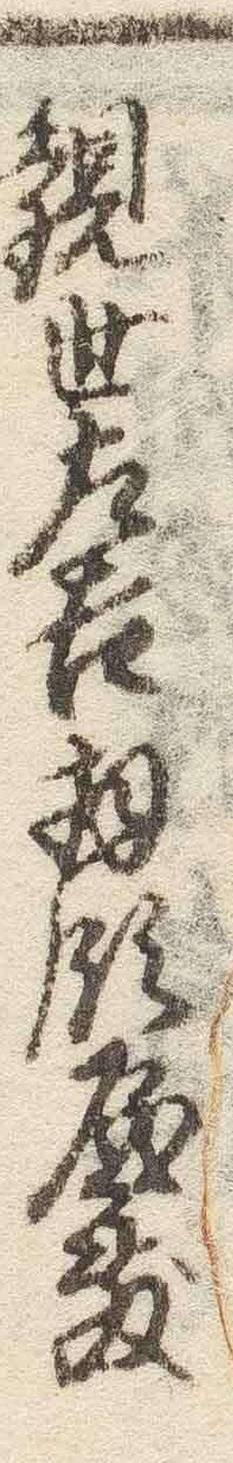観世左吉拝領屋敷
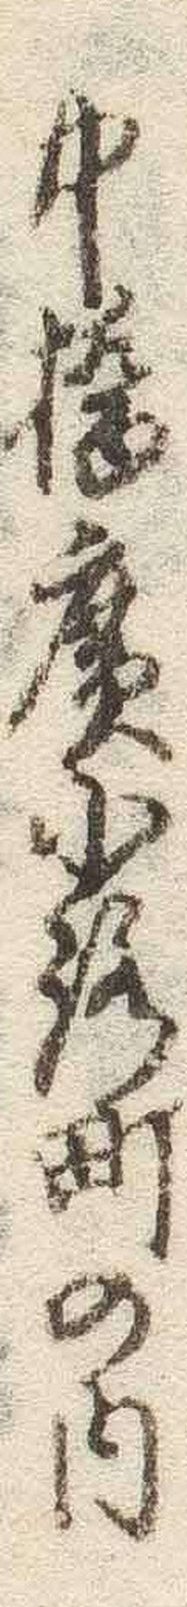中橋広小路町の内
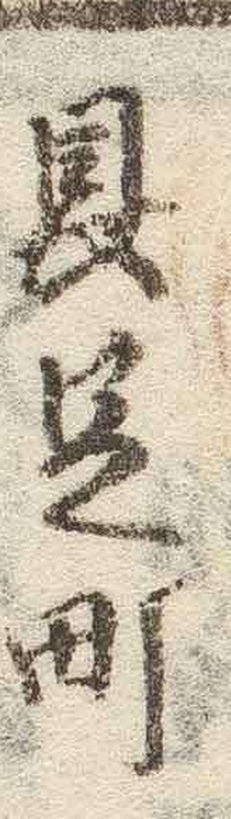具足町
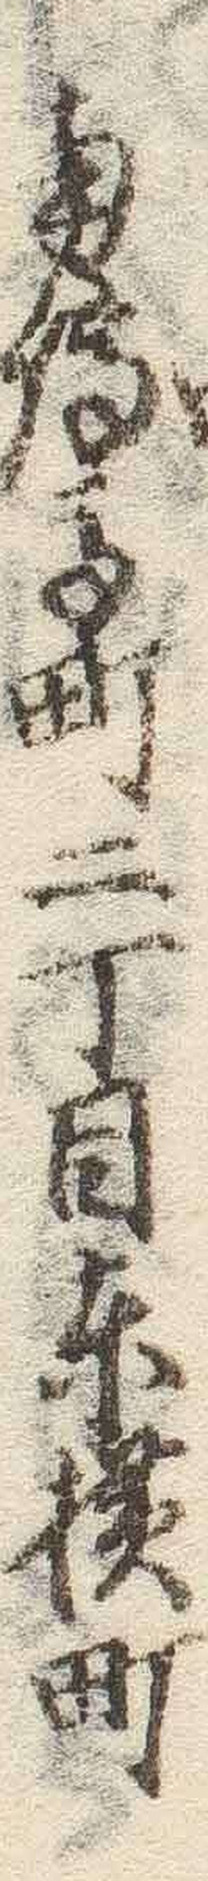南伝馬町二丁目東横町
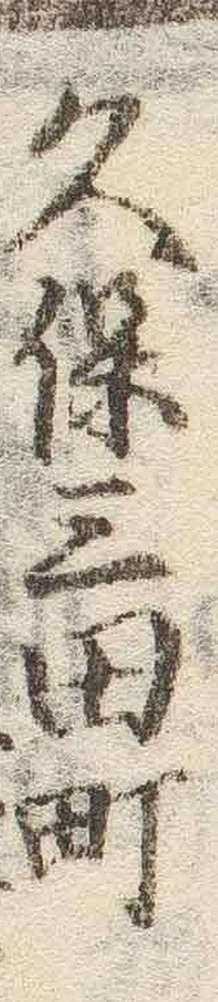久保三田町
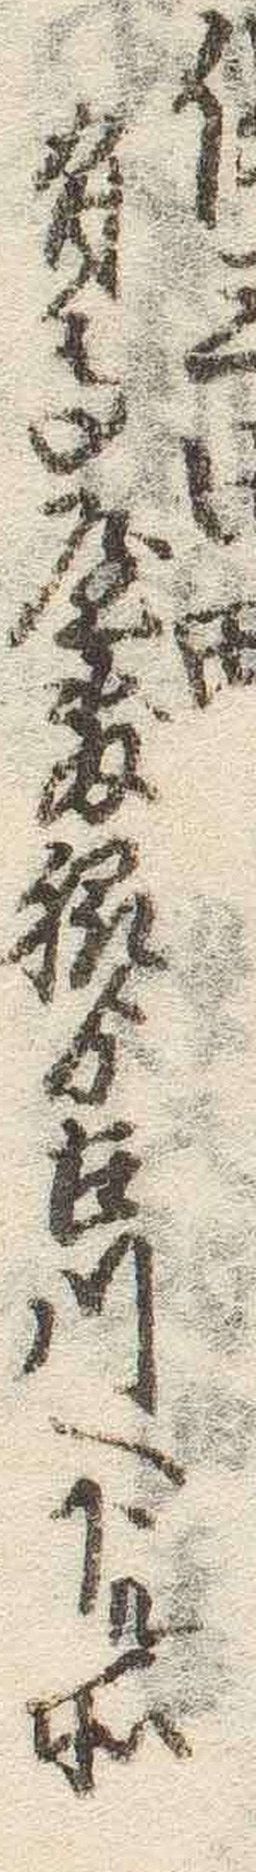有馬屋敷脇ゟ古川へ下ル所
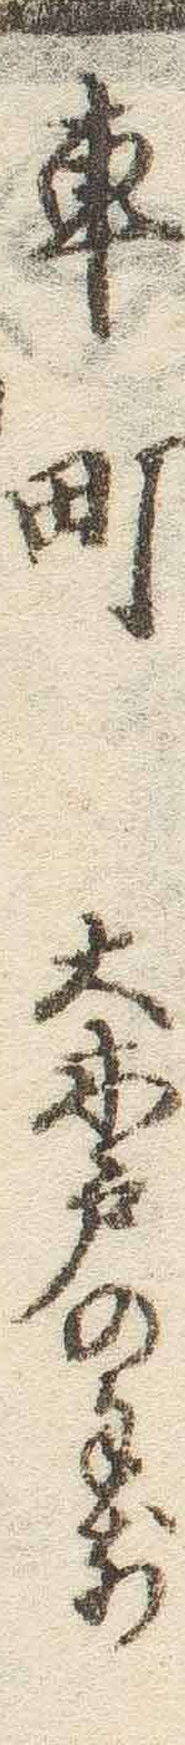車町大木戸の手前
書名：江戸町独案内
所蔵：東京学芸大学附属図書館 国文学研究資料館
